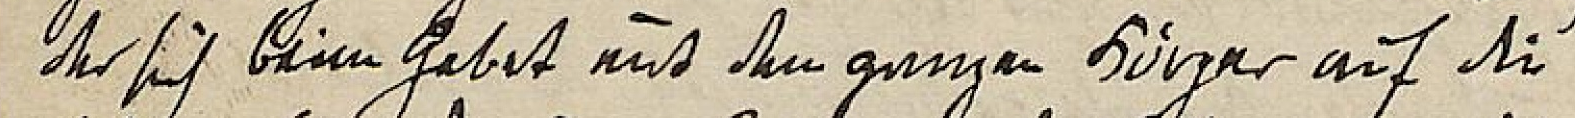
der sich beim Gebet mit dem ganzen Körper auf die
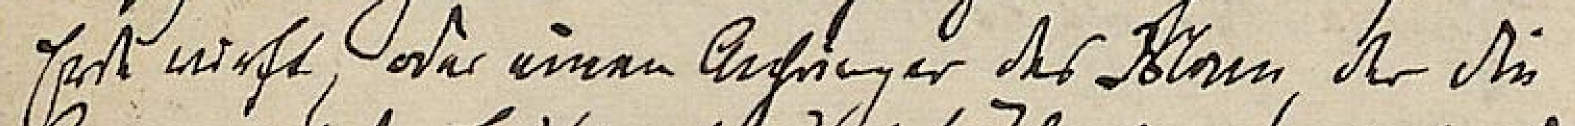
Erde wirft, oder einen Anhänger des Islam, der die
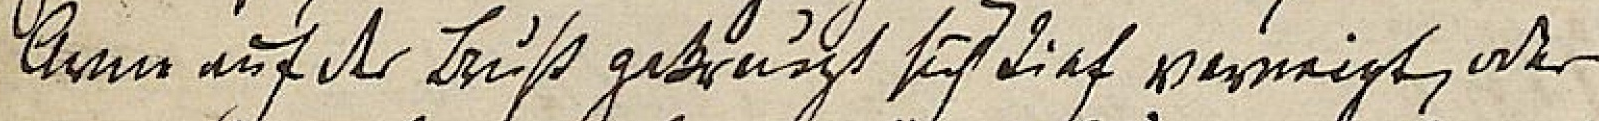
Arme auf der Brust gekreuzt sich tief verneigt, oder
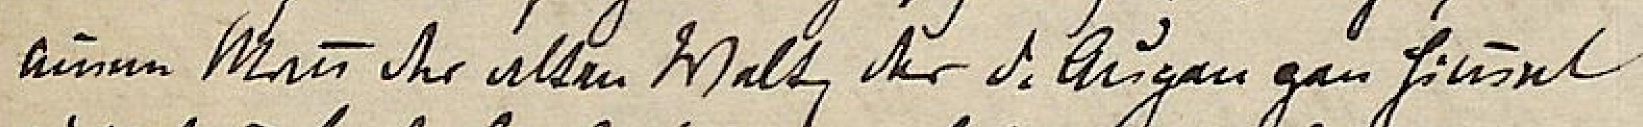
einen Man der alten Welt, der die Augen gen Himel
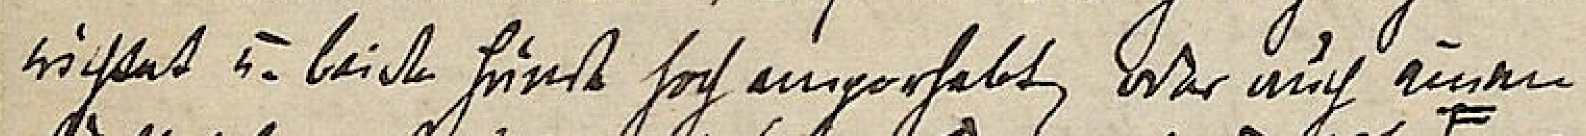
richtet u. beide Hände hoch emporhebt, oder auch einen
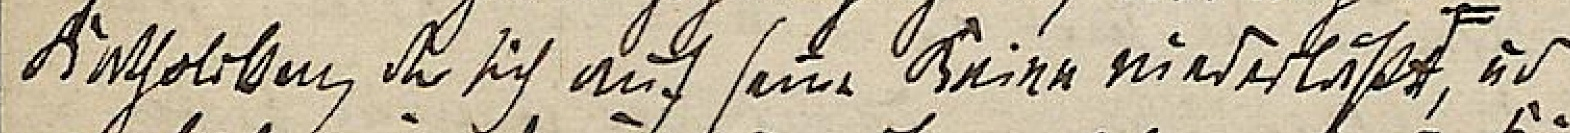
Katholiken, der sich auf seine Kniee niederläßt, und
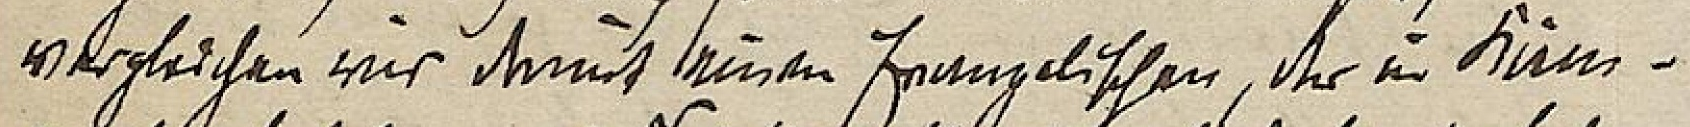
vergleichen wir damit einen Evangelischen, der im Käm¬
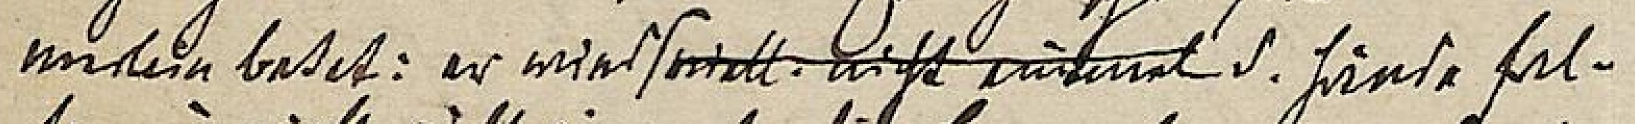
merlein betet: er wird [viell. nicht einmal d. Hände fal¬
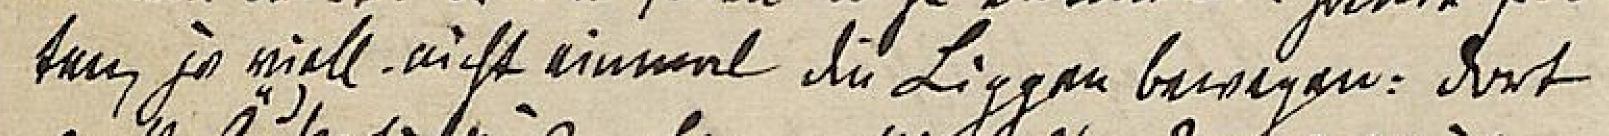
ten, ja viell. nicht einmal die Lippen bewegen: dort
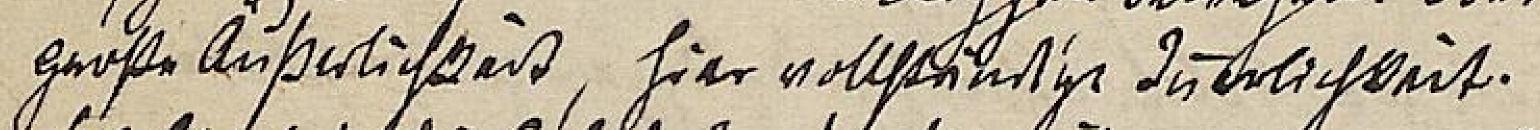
große Äußerlichkeit, hier vollständige Inerlichkeit.
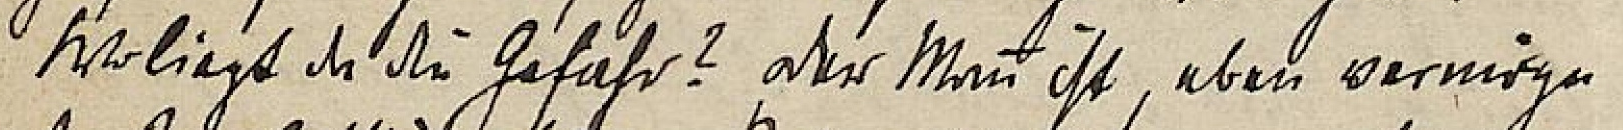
Wo liegt da die Gefahr? Der Man ist, eben vermöge
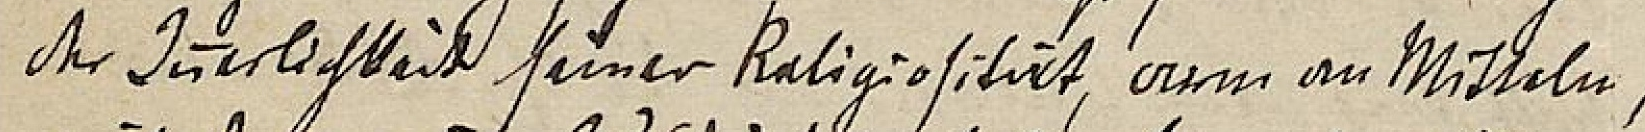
der Inerlichkeit seiner Religiösität, arm an Mitteln,
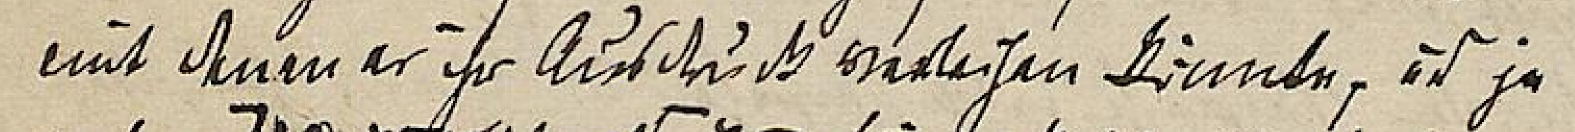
mit denen er ihr Ausdruck verleihen könnte, und je
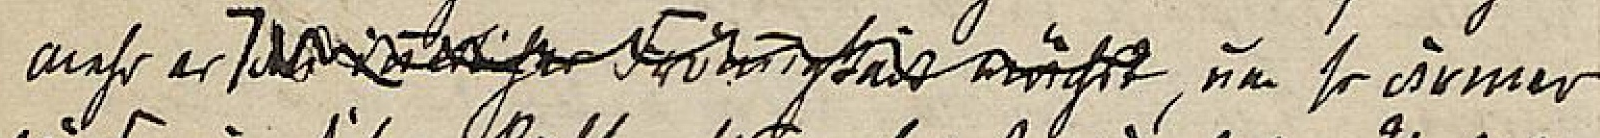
mehr er] die innerliche Frömigkeit wächst, um so ärmer
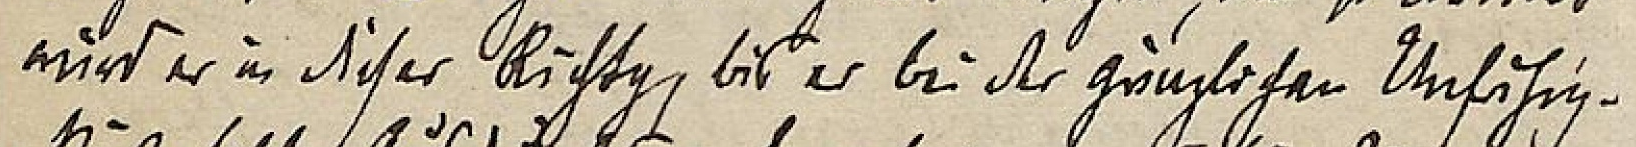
wird er in dieser Richtg, bis er bei der gänzlichen Unfähig¬
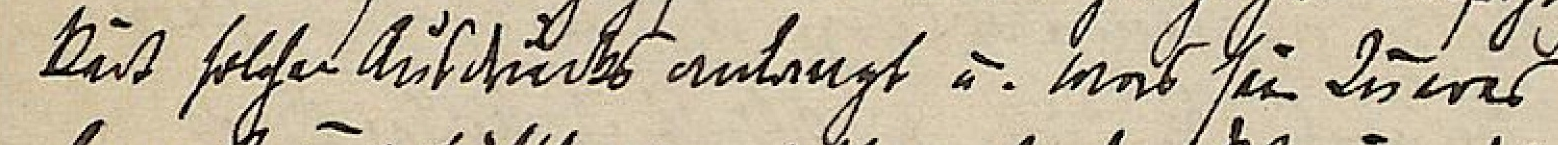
keit solchen Ausdrucks anlangt u. was sein Ineres
